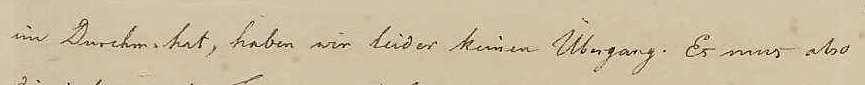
im Durchm. hat, haben wir leider keinen Übergang. Es mus also
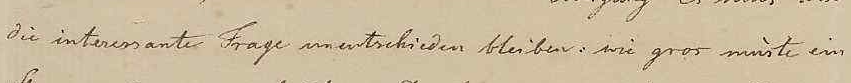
die interessante Frage unentschieden bleiben: wie gros müste ein
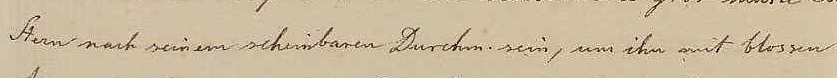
Stern nach seinem scheinbaren Durchm. sein, um ihn mit blossen
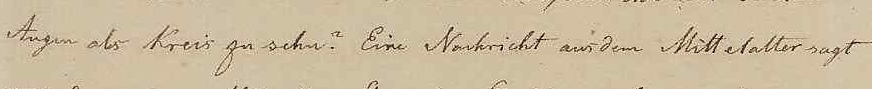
Augen als Kreis zu sehn? Eine Nachricht aus dem Mittelalter sagt
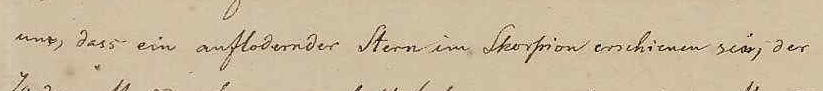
uns, dass ein auflodernder Stern im Skorpion erschienen sei, der
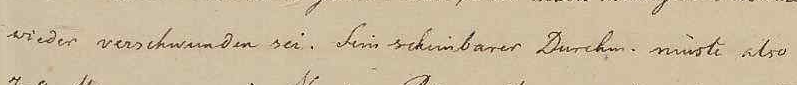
wieder verschwunden sei. Sein scheinbarer Durchm. müste also
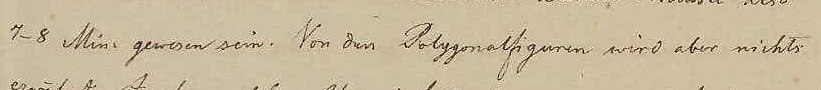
7–8 Min. gewesen sein. Von den Polygonalfiguren wird aber nichts
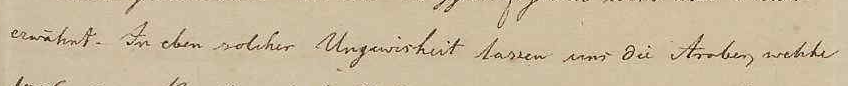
erwähnt. In eben solcher Ungewisheit lassen uns die Araber, welche
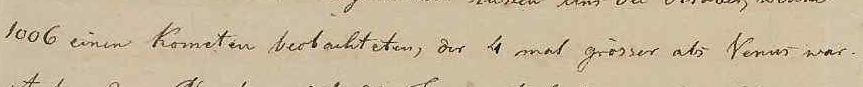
1006 einen Kometen beobachteten, der 4 mal grösser als Venus war.
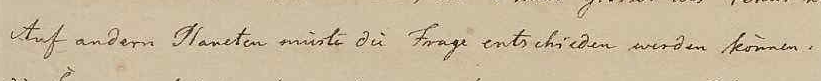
Auf andern Planeten müste die Frage entschieden werden können:
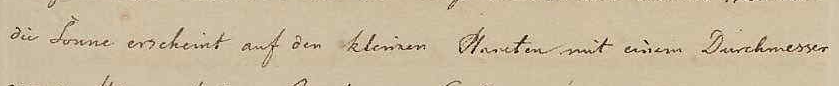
die Sonne erscheint auf den kleinen Planeten mit einem Durchmesser
